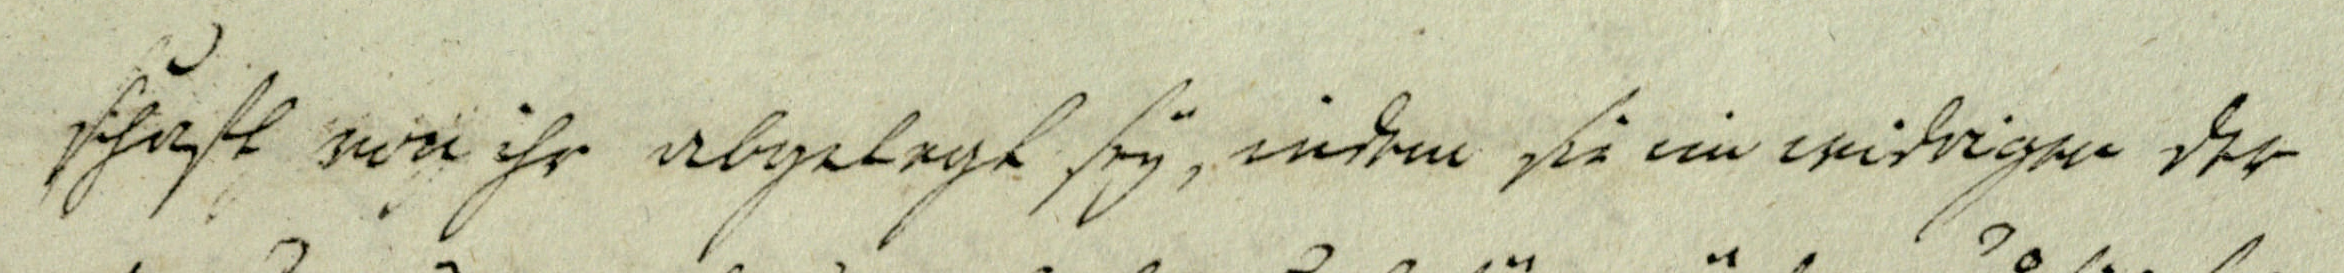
schaft von ihr abgelegt seÿ, indem sie im widrigen der
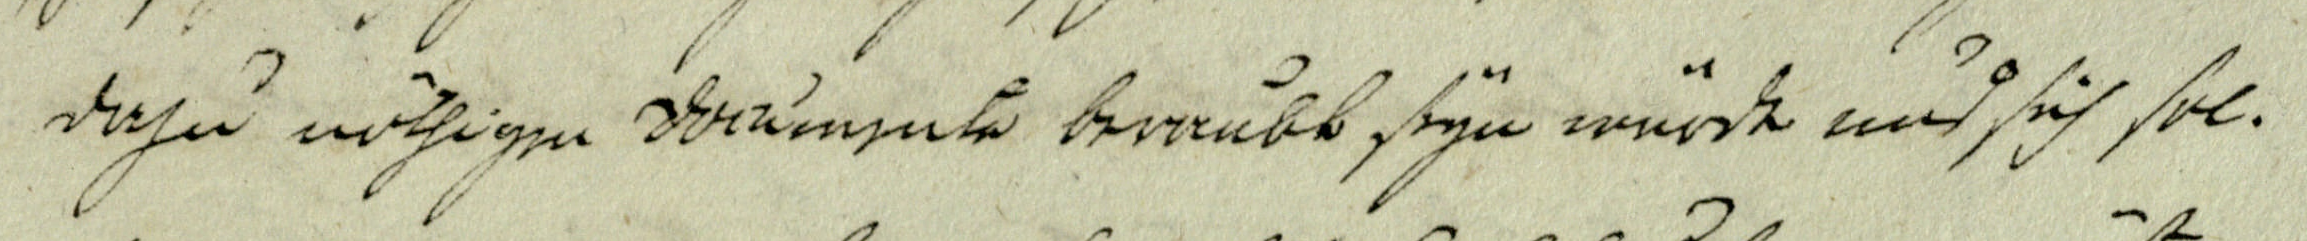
dazu nöthigen Documente beraubt seÿn würde und sich sol¬
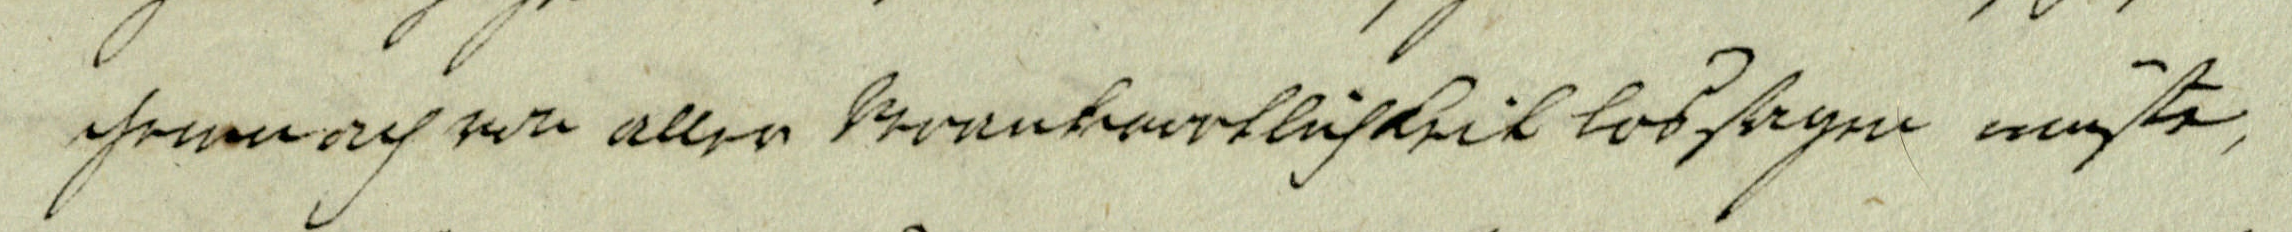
chemnach von aller Verantwortlichkeit lossagen müste,
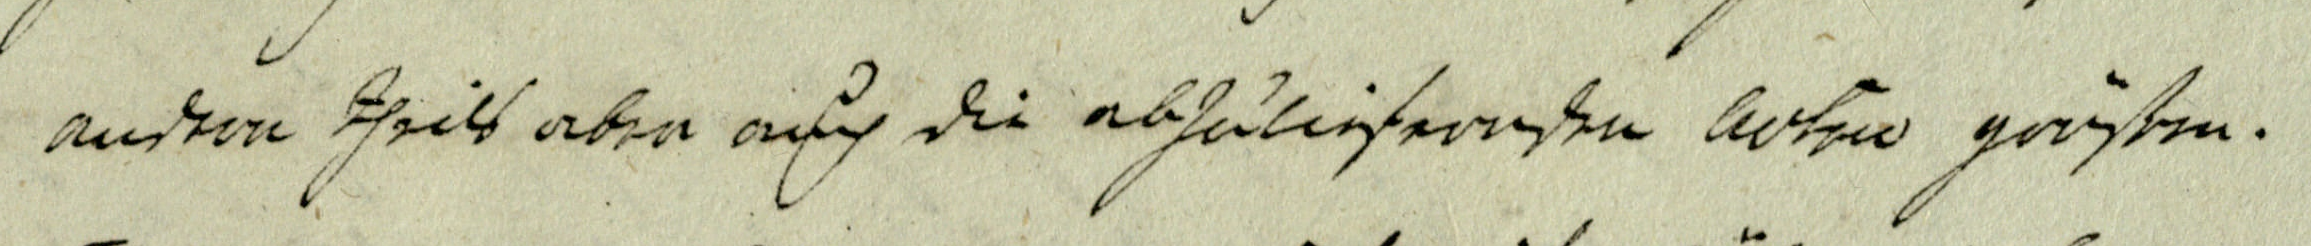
andern theils aber auch die abzuliefernden Acten grösten¬
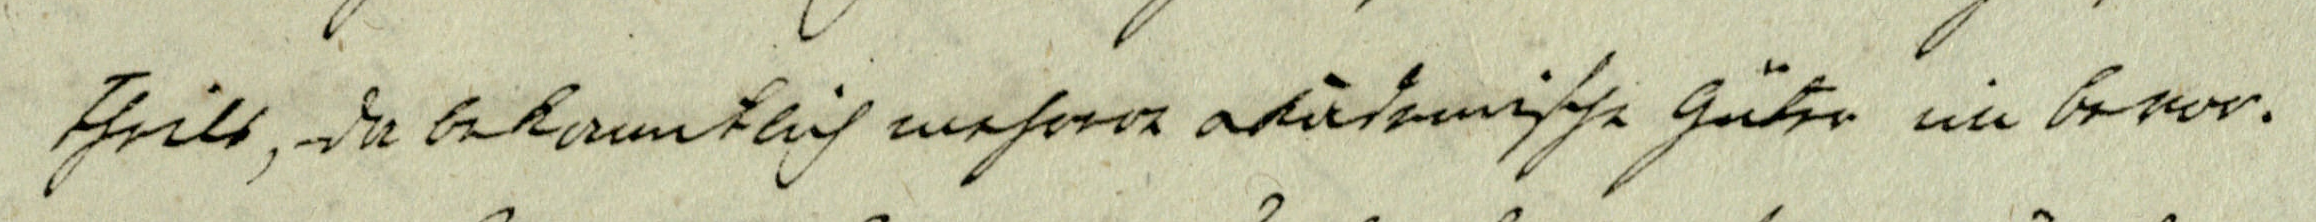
theils, da bekanntlich mehrere akademische Güter im bevor¬
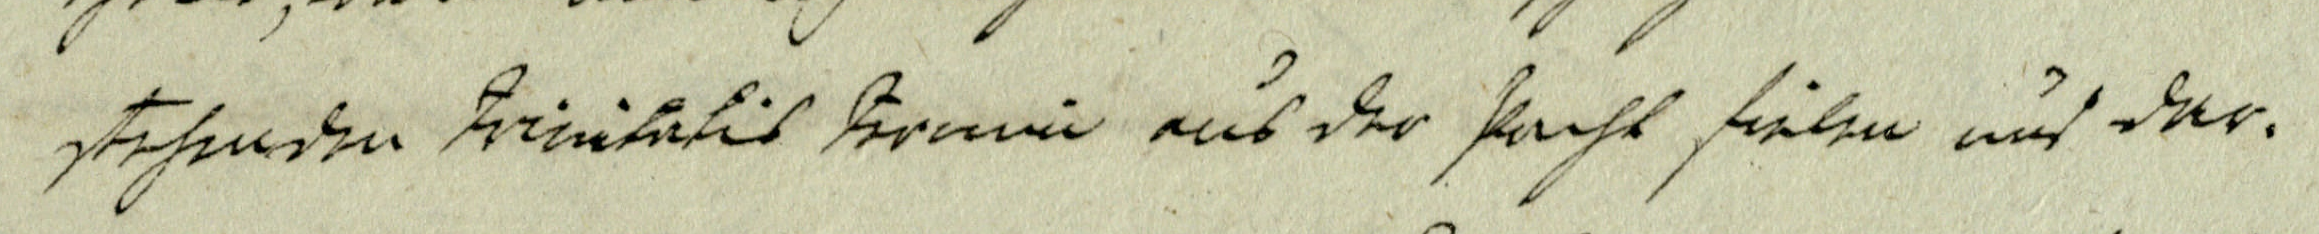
stehenden Trinitatis Termin aus der Pacht fielen und dar¬
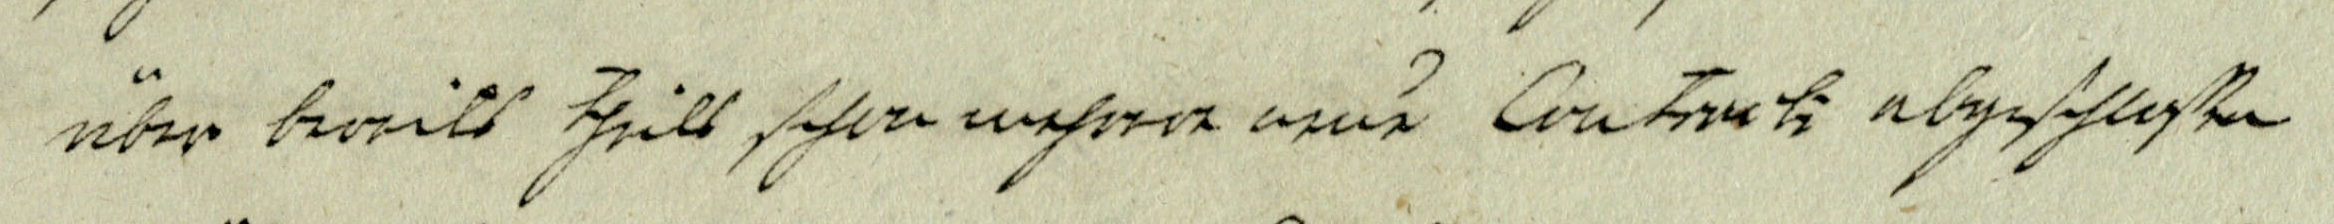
über bereits Theils schon mehrere neue Contracte abgeschlossen
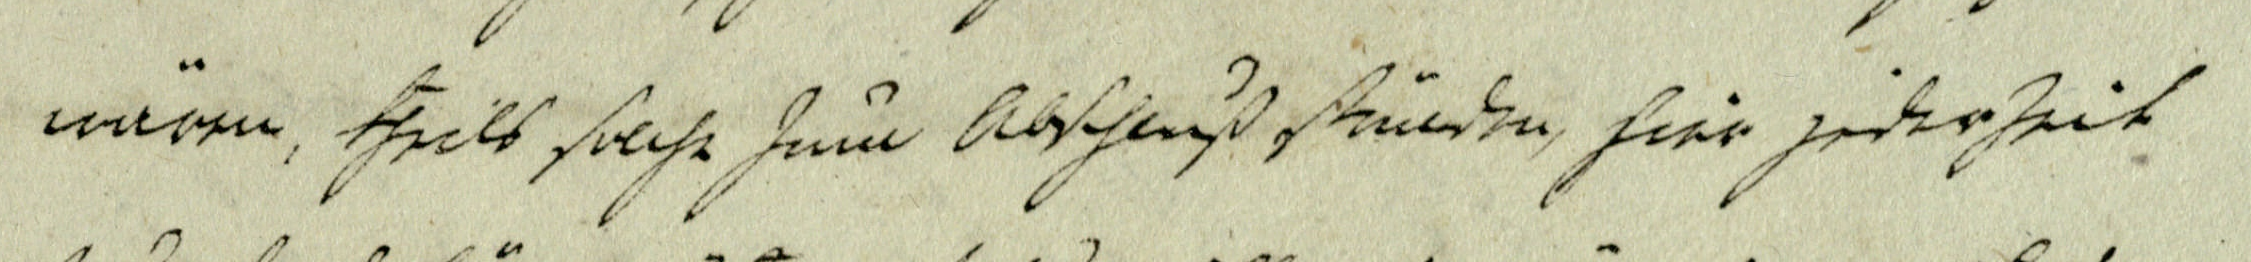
wären, theils solche zum Abschluß stünden, hier jederzeit
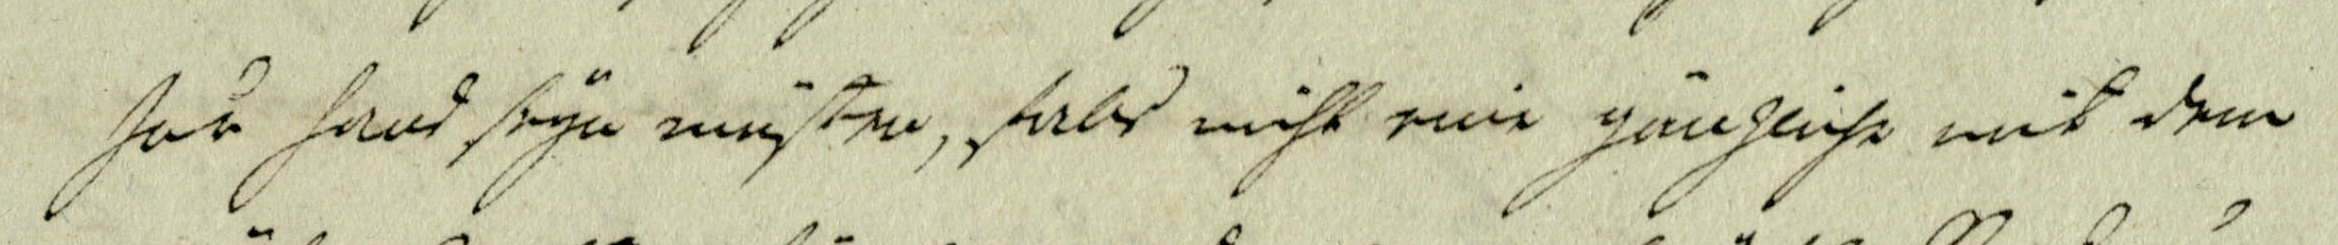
zur Hand seÿn müsten, falls nicht eine gänzliche mit dem
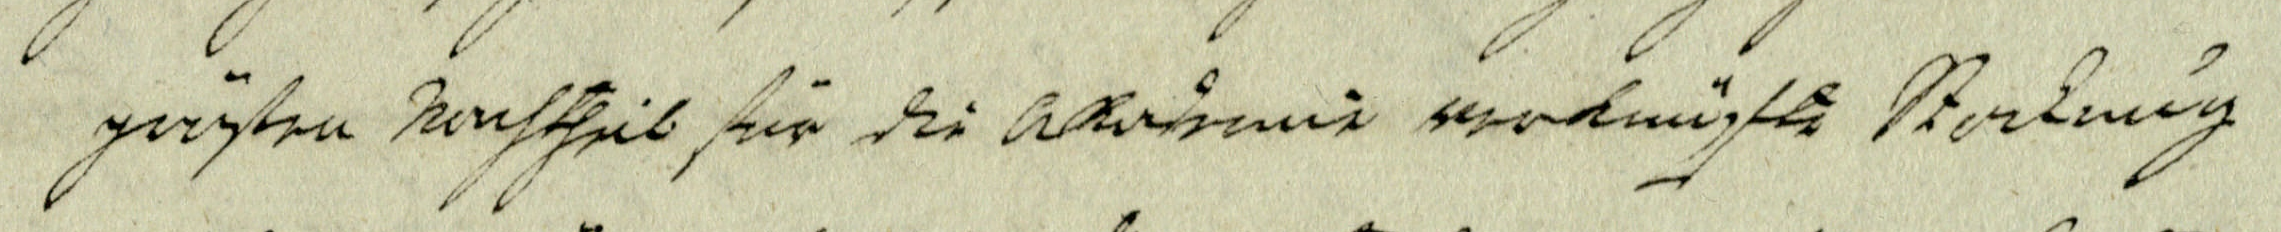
grösten Nachtheil für die Akademie verknüpfte Stockung
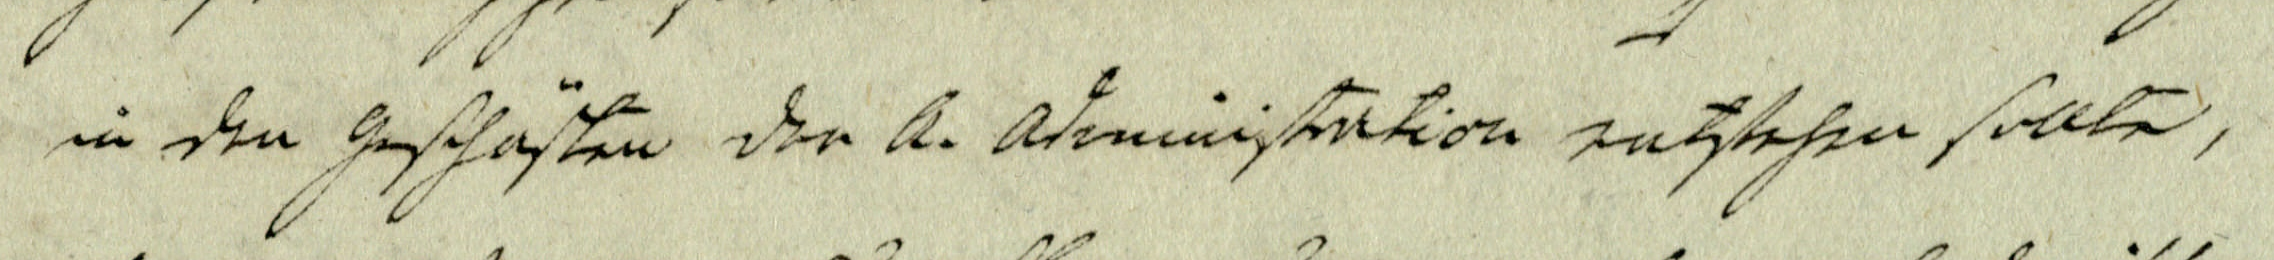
in den Geschäften der A. Administration entstehen sollte,
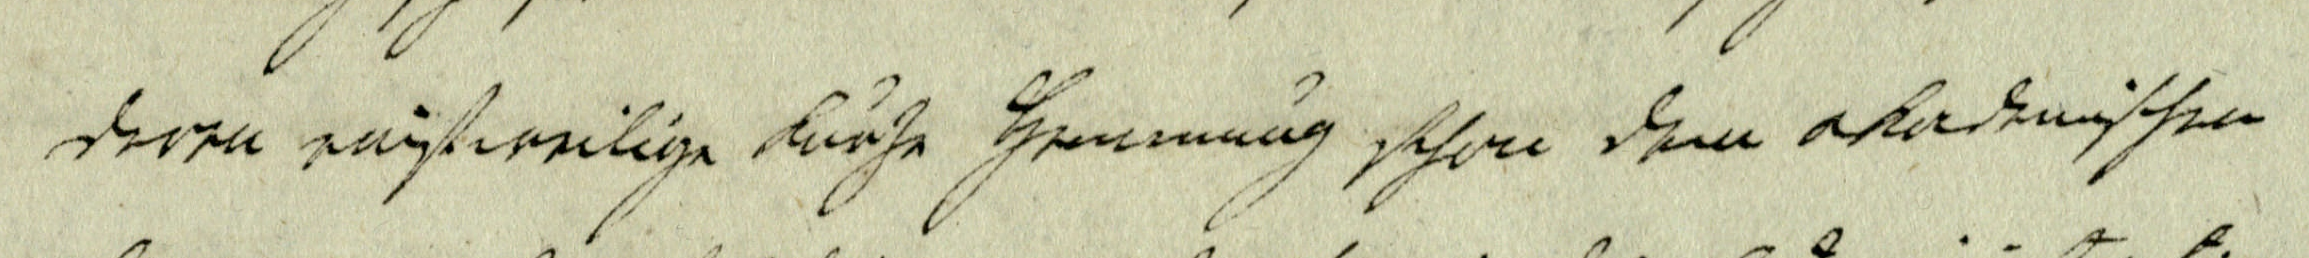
deren einstweilige kurze Hemmung schon dem akademischen
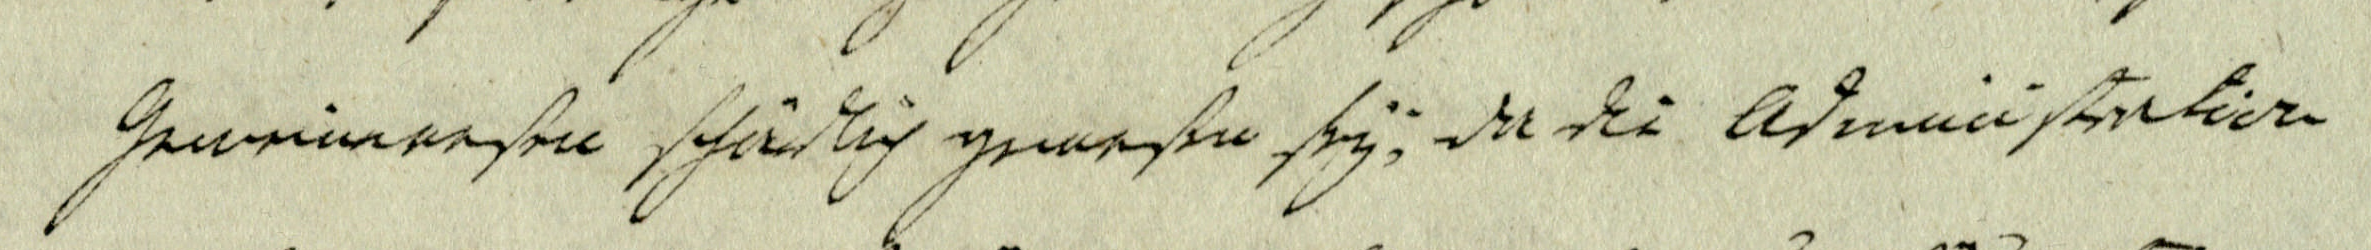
Gemeinwesen schädlich gewesen seÿ, da die Administration
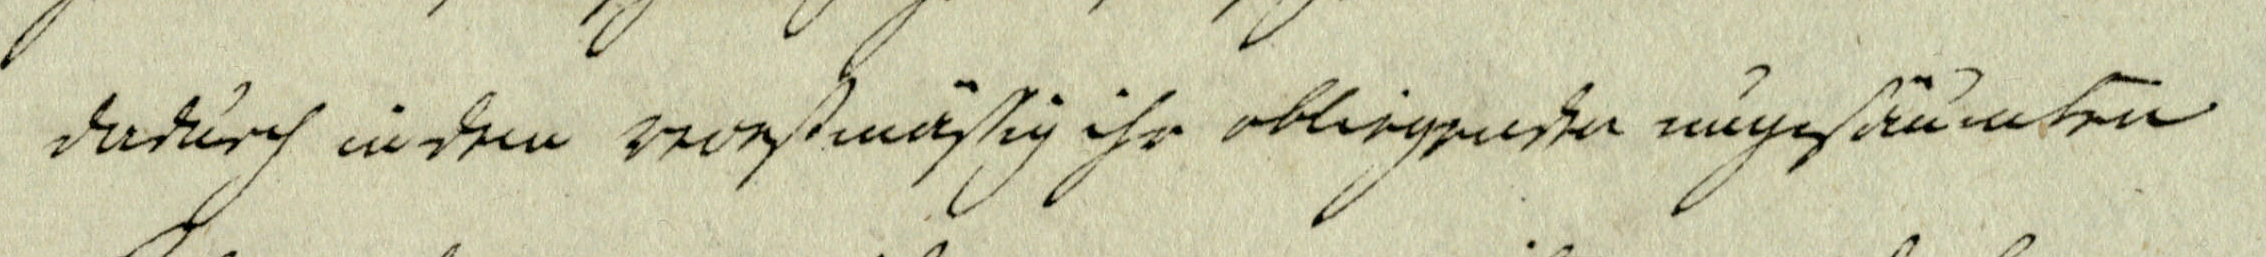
dadurch in dem receßmässig ihr obliegenden ungesäumten
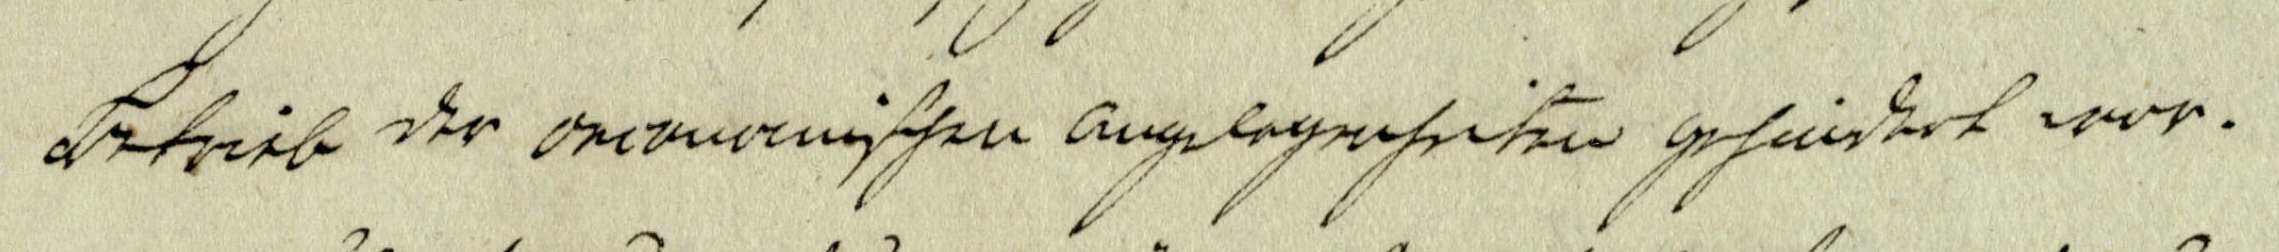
Betrieb der oeconomischen Angelegenheiten gehindert wor¬
